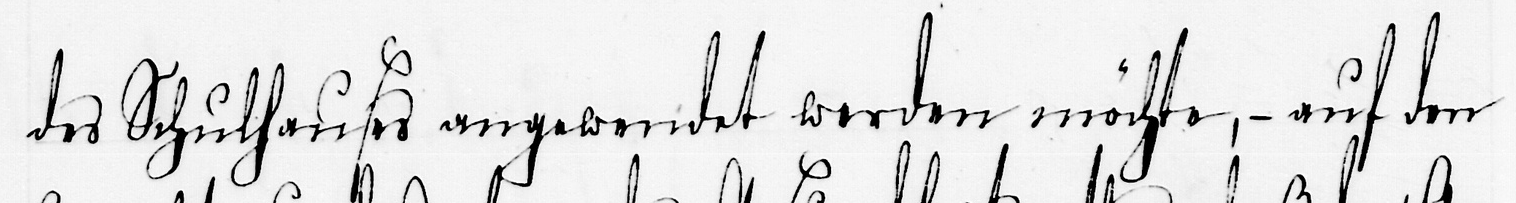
des Schulhauses angewendet werden möchte, – auf den
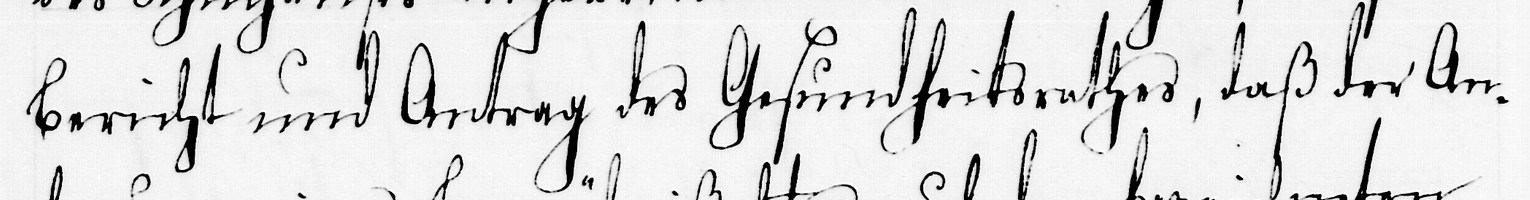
Bericht und Antrag des Gesundheitsrathes, daß der An¬
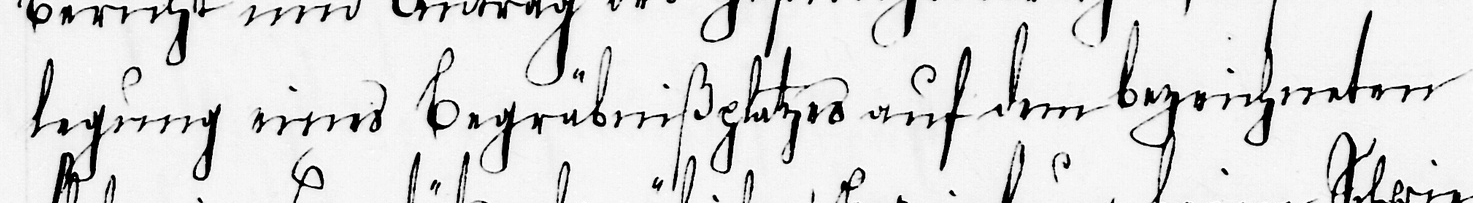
legung eines Begräbnißplatzes auf dem bezeichneten
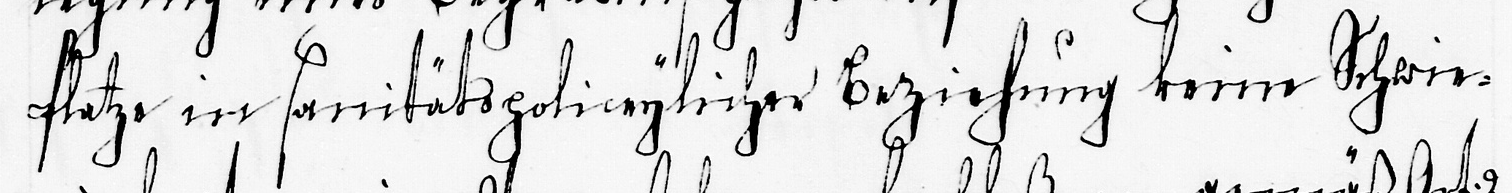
Platze in sanitätspoliceylicher Beziehung keine Schwie¬
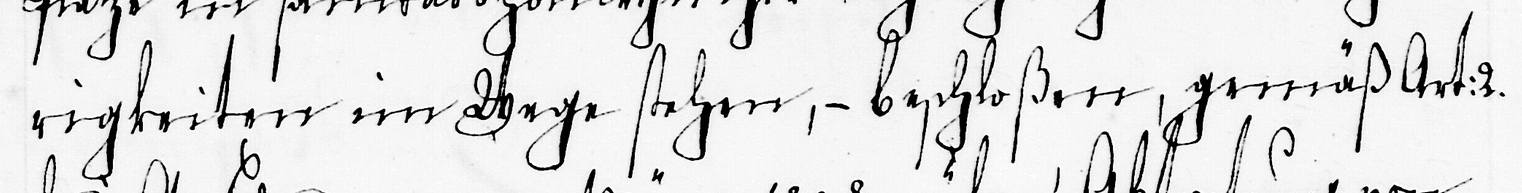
rigkeiten im Wege stehen, – beschloßen, gemäß Art:
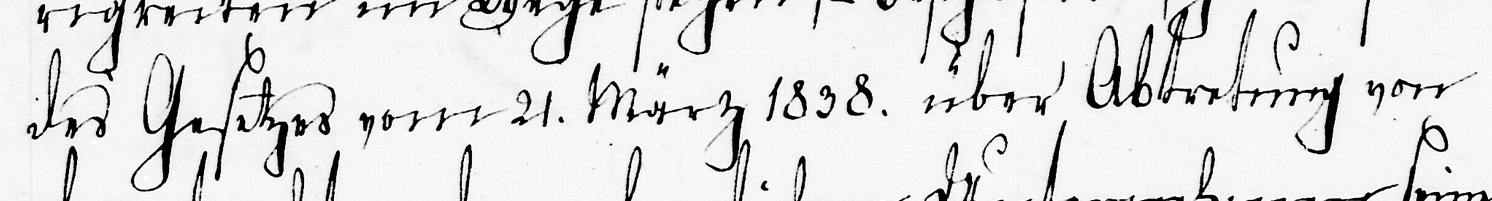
des Gesetzes vom 21. März 1838. über Abtretung von
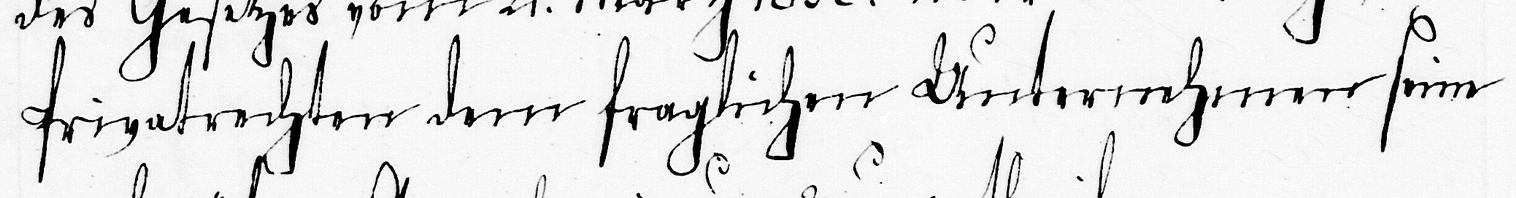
Privatrechten dem fraglichen Unternehmen seine
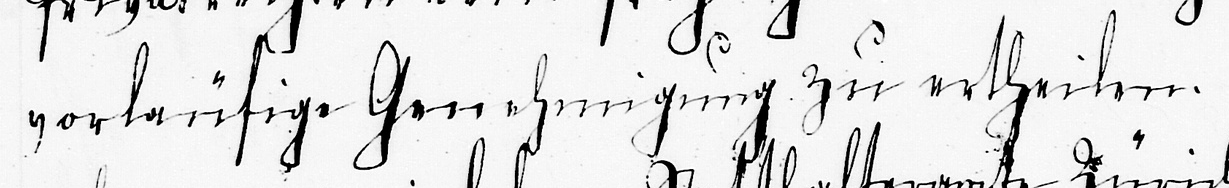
vorläufige Genehmigung zu ertheilen.
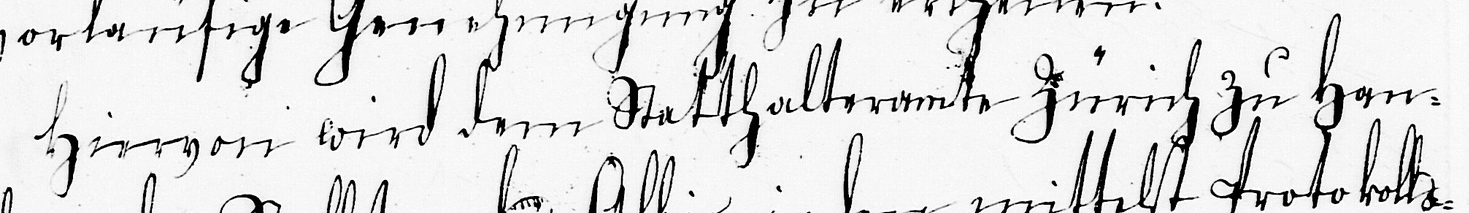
Hiervon wird dem Statthalteramte Zürich zu Han¬
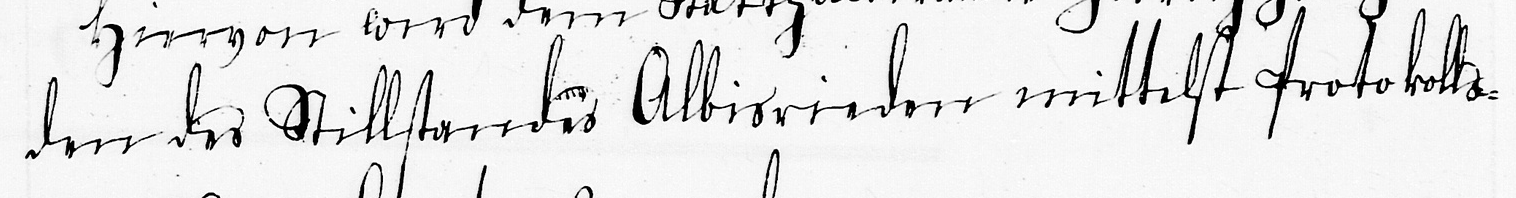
den des Stillstandes Albisrieden mittelst Protkoll¬
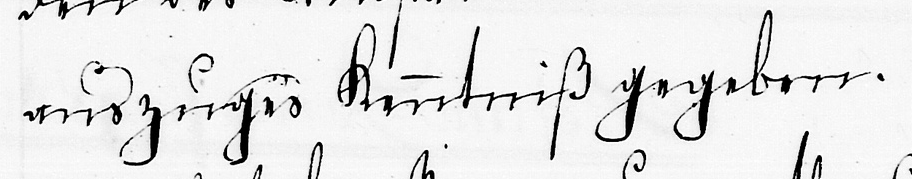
sauszuges Kenntniß gegeben.
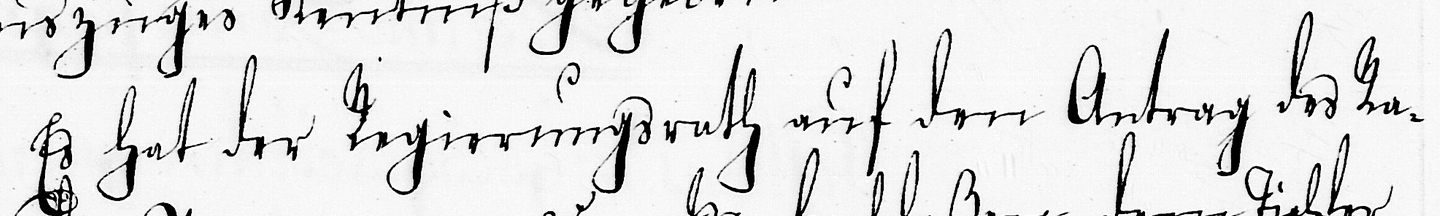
Es hat der Regierungsrath auf den Antrag des Ra¬
